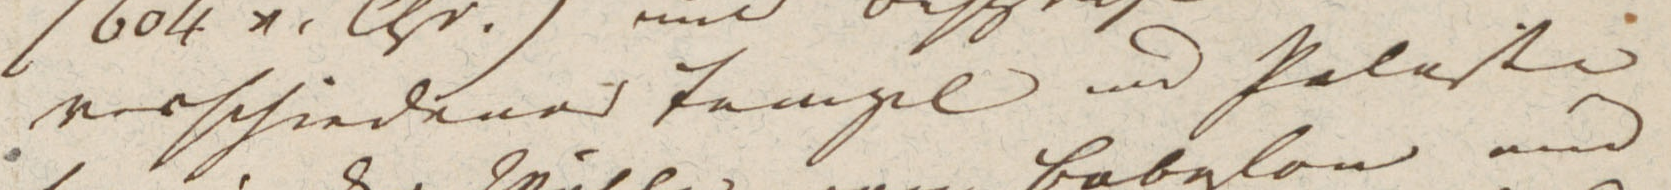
verschiedener Tempel und Paläste
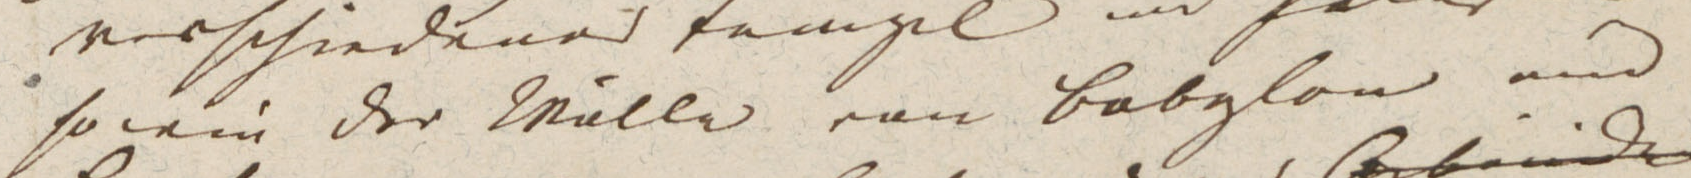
so wie der Wälle von Babyon und
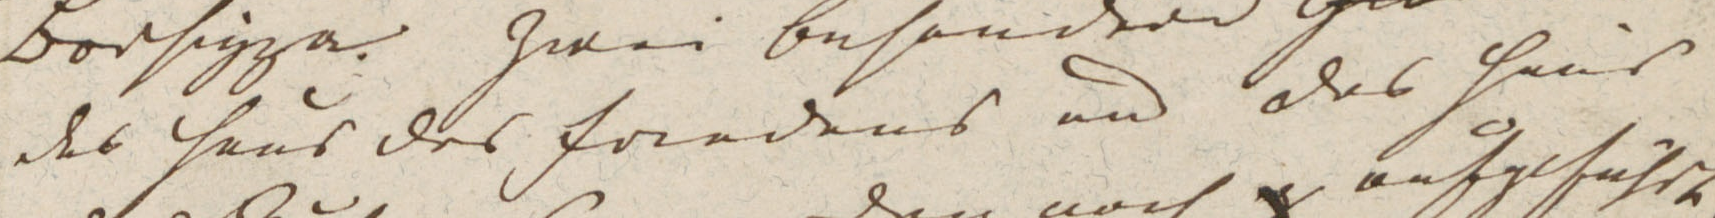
das Haus des Friedens und das Haus
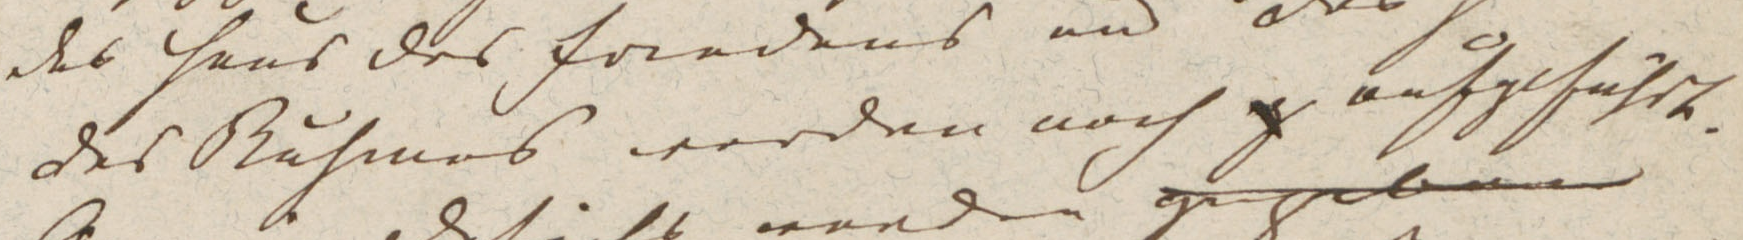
des Ruhmes werden noch g aufgeführt.
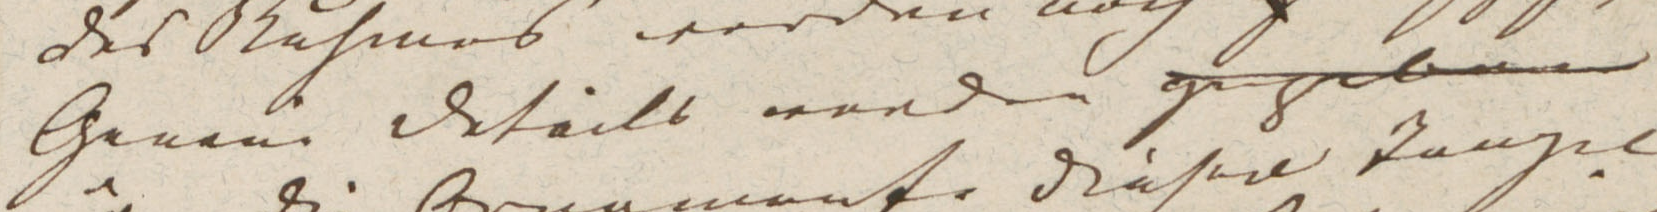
Genaue Details werden gegeben
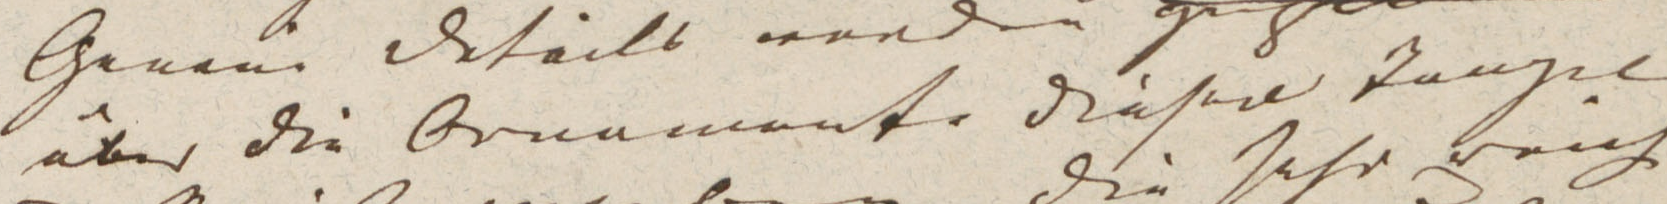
über die Ornamente dieser Tempel
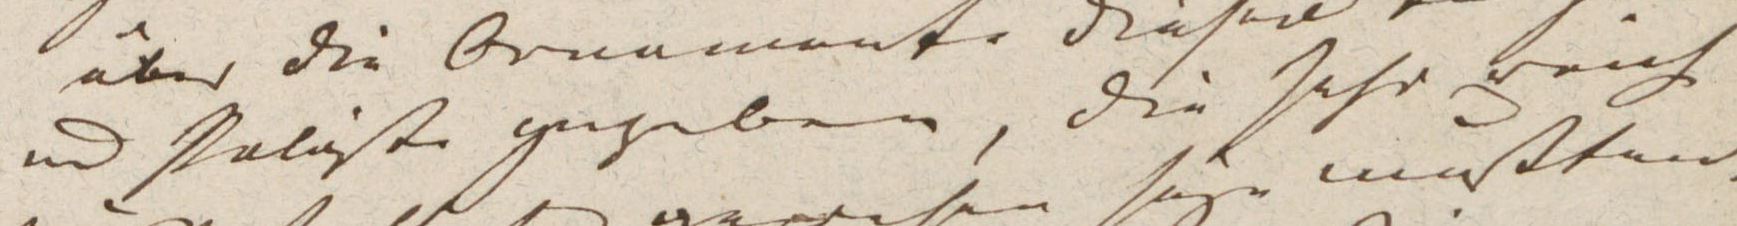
und Paläste gegeben, die sehr reich
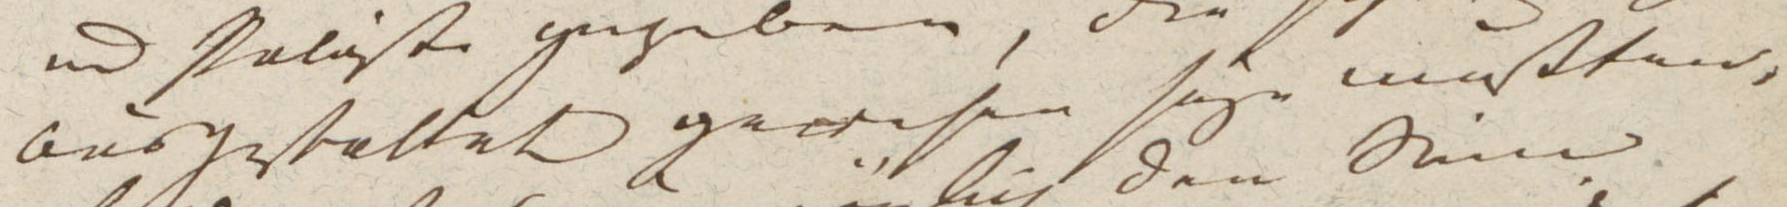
ausgestaltet gewesen seyn mussten,
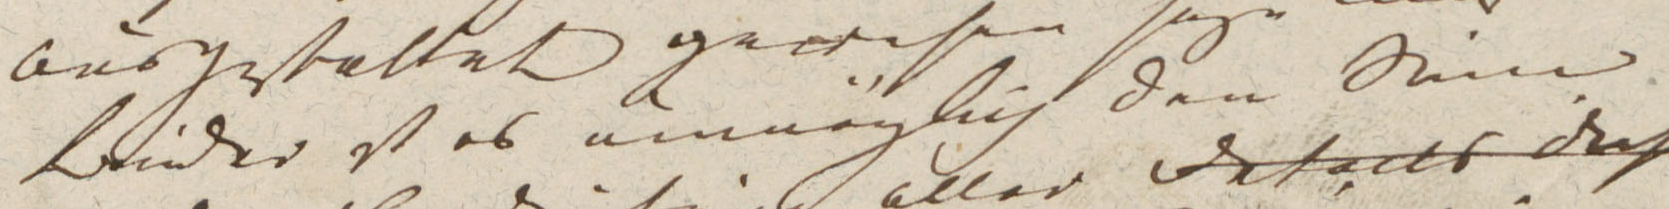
Leider ist es unmöglich den Sinn
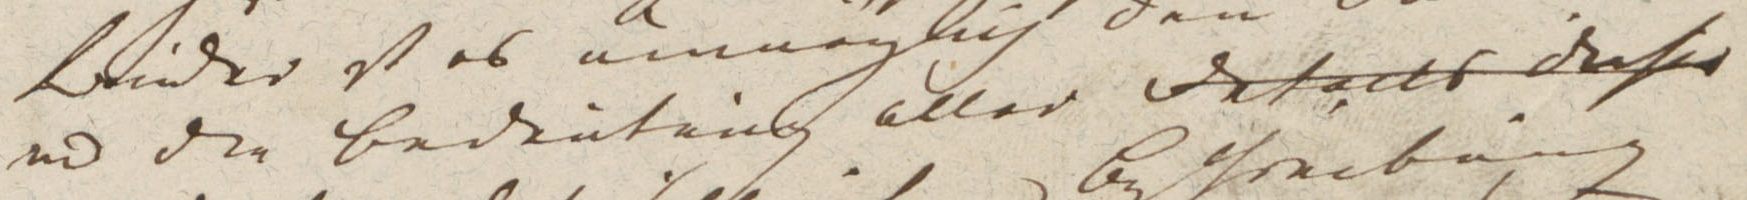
und die Bedeutung aller Details dieser
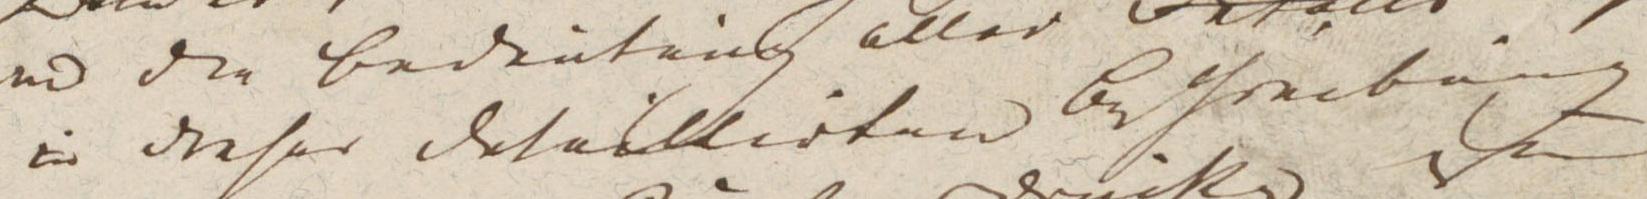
in dieser detaillirten Beschreibung
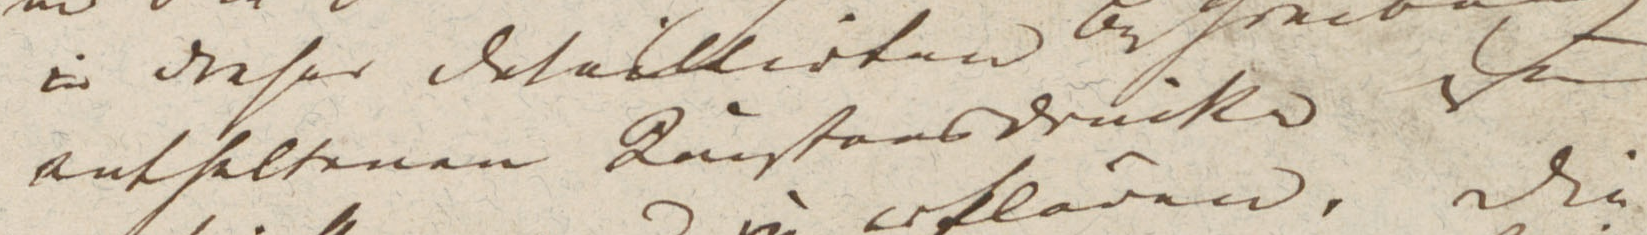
enthaltenen Kunstausdrücke zu
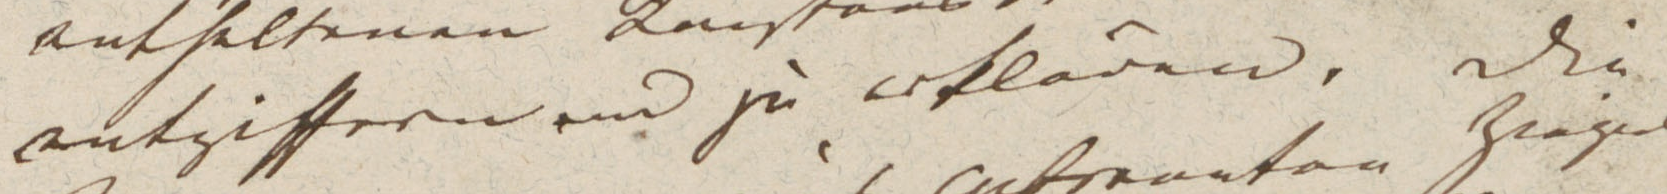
entziffern und zu erklären. Die
